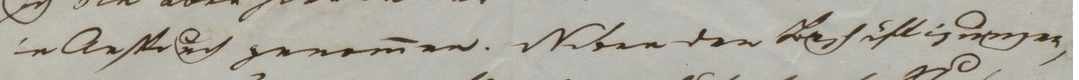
in Anspruch genommen. Neben den Beschäftigungen,
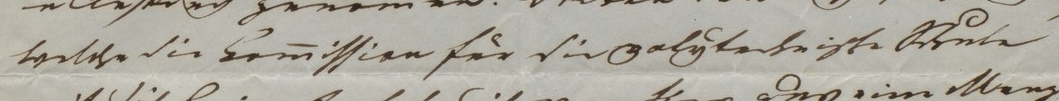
welche die Commission für die polytechnische Schule
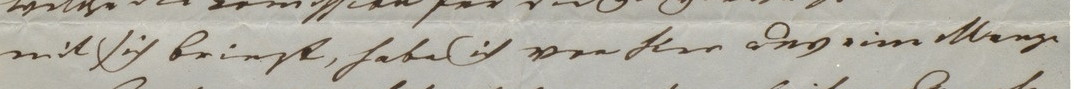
mit sich bringt, habe ich von hier aus eine Menge
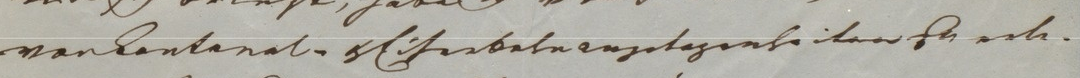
von Cantonal- & Eisenbahnangelegenheiten zu erle-
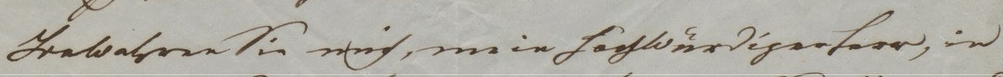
Bewahren Sie mich, mein hochwürdiger Herr, in
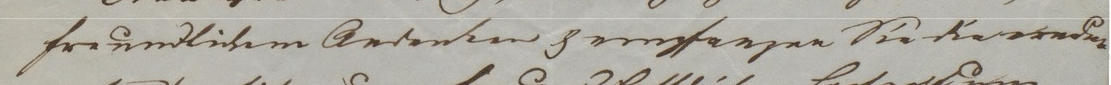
freundlichem Andenken & empfangen Sie die erneu-
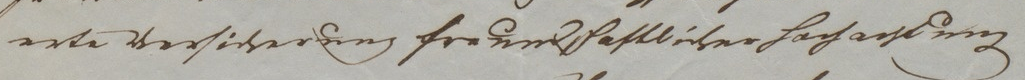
erte Versicherung freundschaftlicher Hochachtung
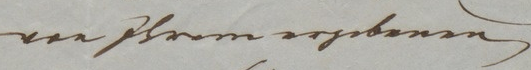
von Ihrem ergebenen
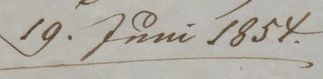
19. Juni 1854.
